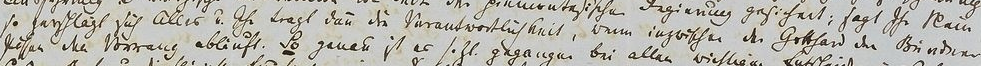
so zerschlägt sich Alles u. Ihr tragt dann die Verantwortlichkeit, wenn inzwischen der Gotthard den Bündner
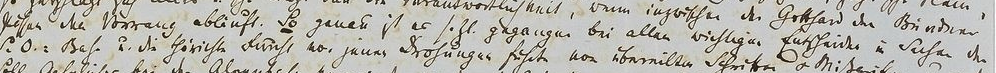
Pässen den Vorrang abläuft. So genau ist es s. Zt. gegangen bei allen wichtigen Entscheiden in Sachen der
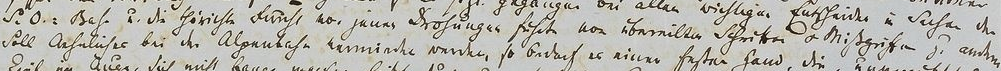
S.O.-Bahn u. die thörichte Furcht vor jenen Drohungen führte von übereilten Schritten & Mißgriffen zu andern.
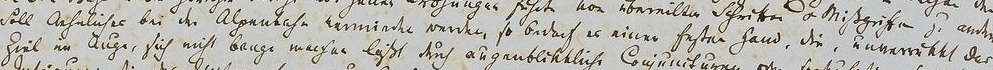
Soll Aehnliches bei der Alpenbahn vermieden werden, so bedarf es einer festen Hand, die, unverrükkt das
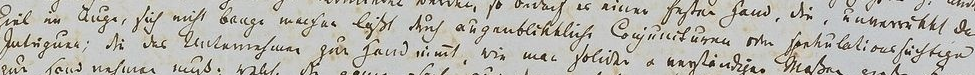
Ziel im Auge, sich nicht bange machen läßt durch augenblikkliche Conjuncturen von spekulationssüchtigen
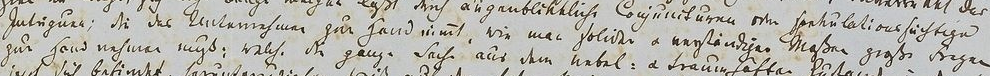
Intriguen; die das Unternehmen zur Hand nimmt, wie man solider & verständiger Maßen große Fragen
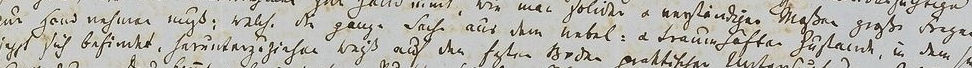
zur Hand nehmen muß; welche die ganze Sache aus dem nebel- & traumhaften Zustande, in dem sie
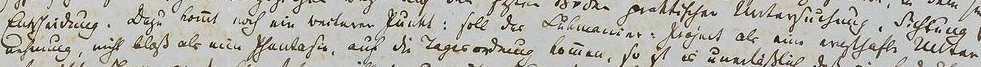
Entscheidung. Dazu kommt noch ein weiterer Punkt: soll das Lukmanier-Project als eine ernsthafte Unter-
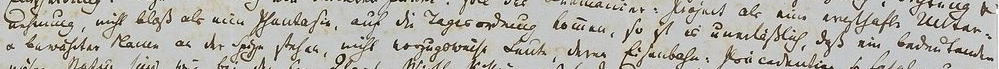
nehmung, nicht bloß als eine Phantasie, auf die Tagesordnung kommen, so ist es unerläßlich, daß ein bedeutender
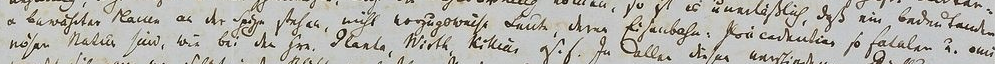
& bewährter Name an der Spizze stehen, nicht vorzugsweise Leute, deren Eisenbahn-Präcedentien so fataler u. omi-
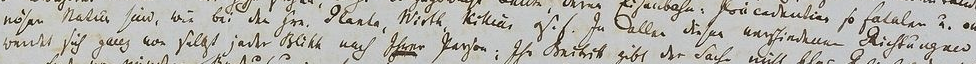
nöser Natur sind, wie bei den Hrn. Planta, Wirth, Killias u. s. f. In allen diesen verschiedenen Richtungen
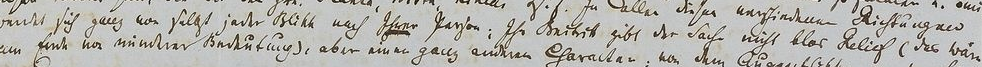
wendet sich ganz von selbst jeder Blikk nach Ihrer Person; Ihr Beitritt gibt der Sache nicht blos Relief (das wäre
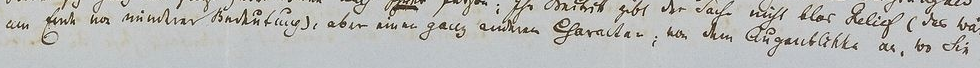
am Ende von minderer Bedeutung), aber einen ganz anderen Character; von dem Augenblikke an, wo Sie
